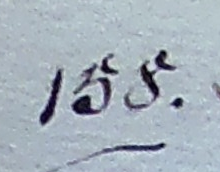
158.
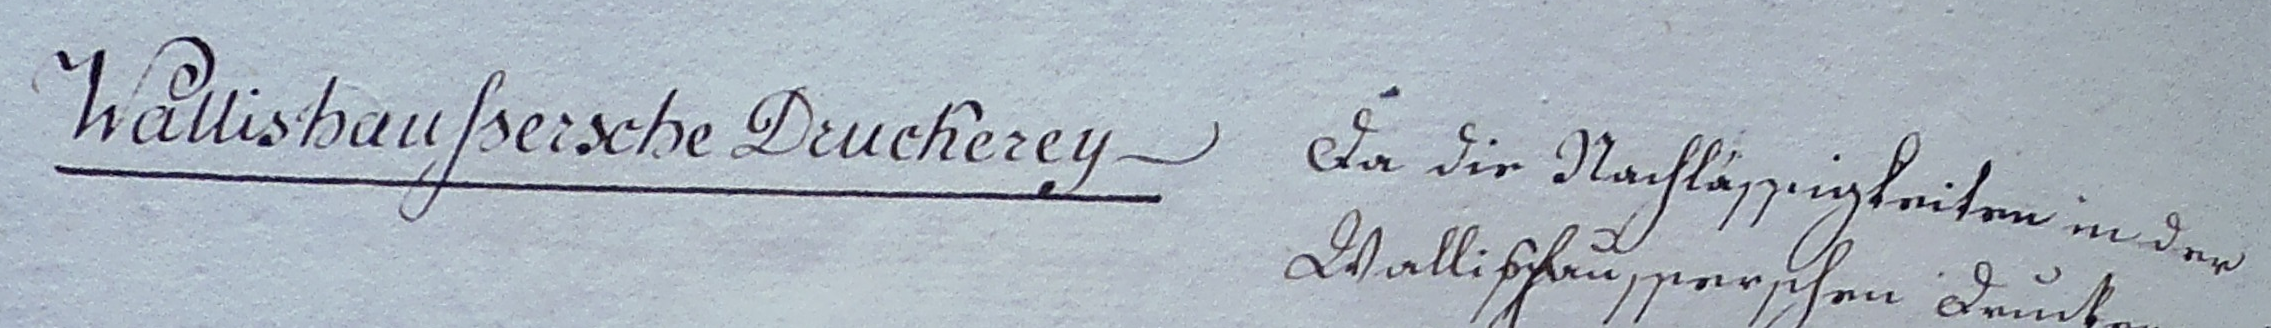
Wallishaussersche Druckerey Da die Nachlässigkeiten in der
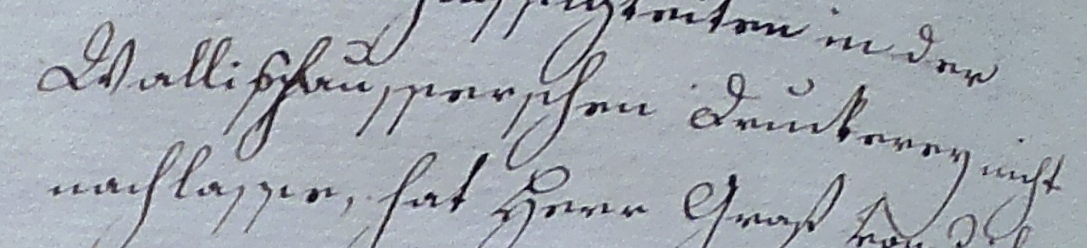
Wallishausserschen Druckerey nicht
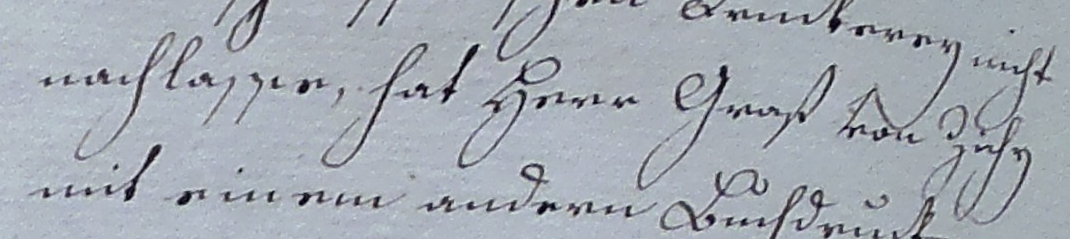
nachlasse, hat Herr Graf von Zichy
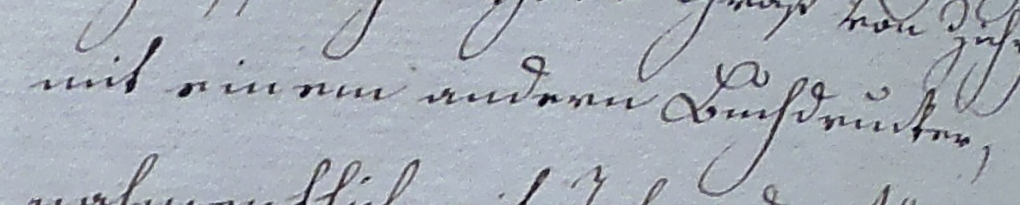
mit einem andern Aufdruncker,
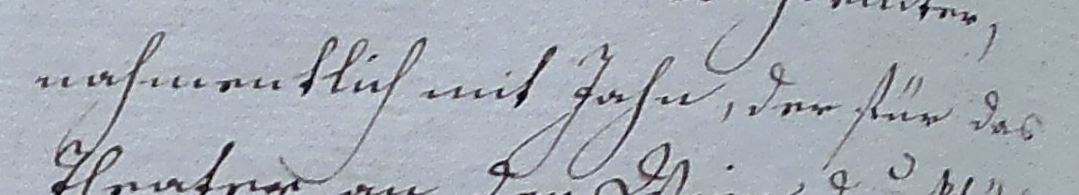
nahmentlich mit Jahn,der für das
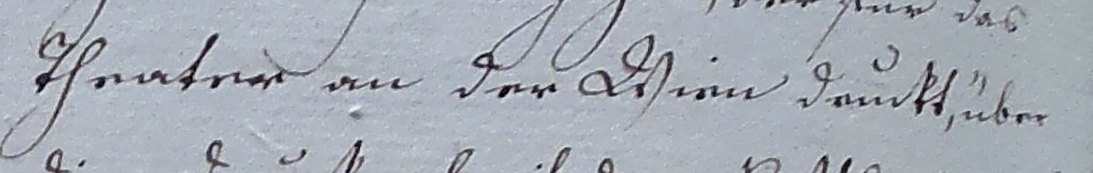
Theater an der Wien druckt, über
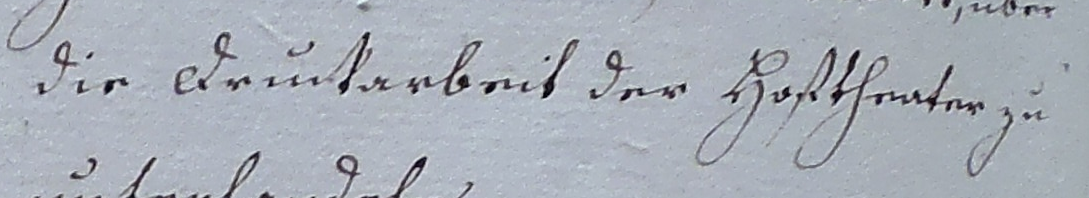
die Druckarbeit der Hoftheater zu
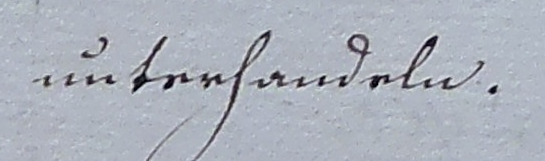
unterhandeln.
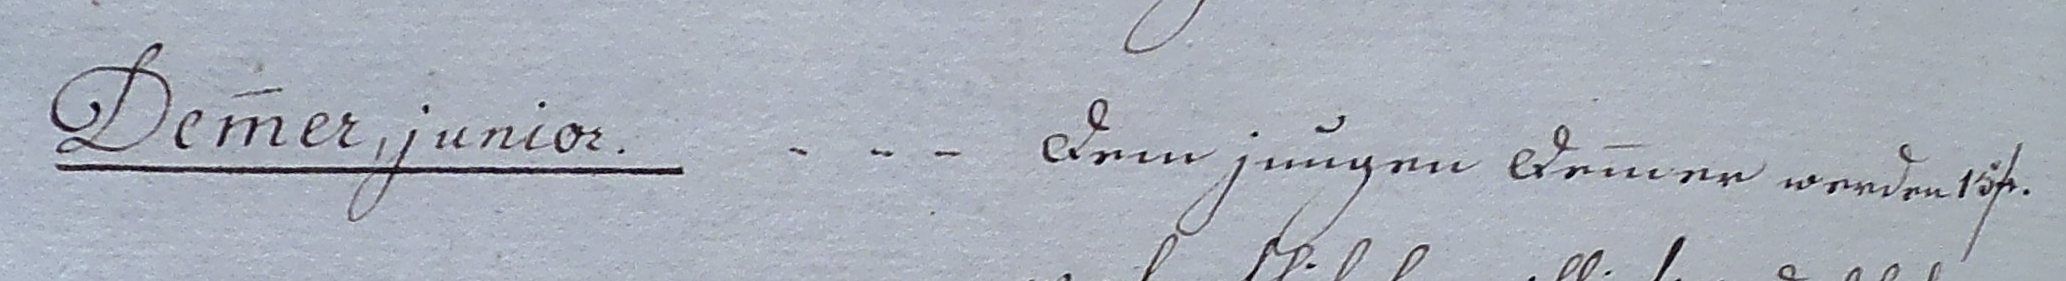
Dem̅er, junior. .. .. .. Dem jungen Dem̅er werden 15fr.
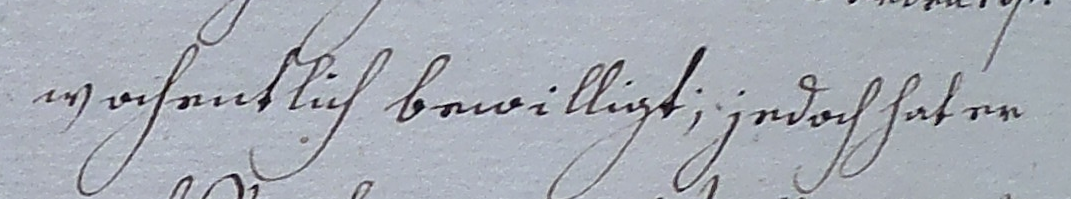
wochentlich bewilligt; jedoch hat er
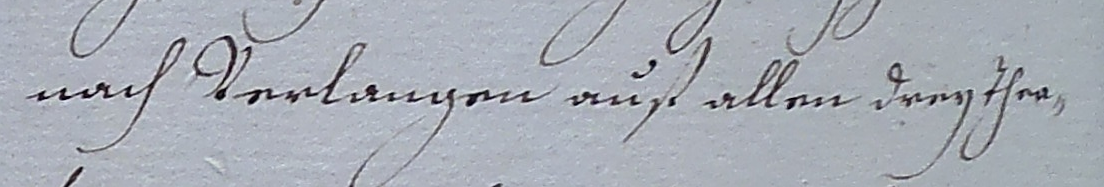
nach Verlangen auf allen drey Thea¬
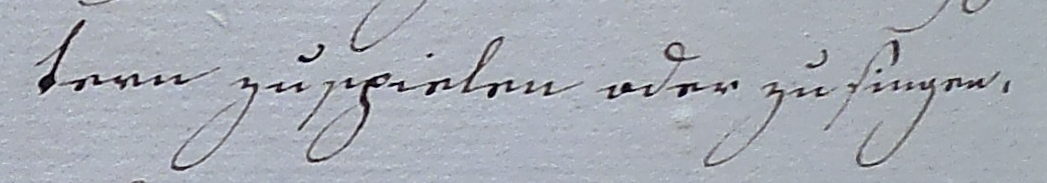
tern zu spielen oder zu singen.
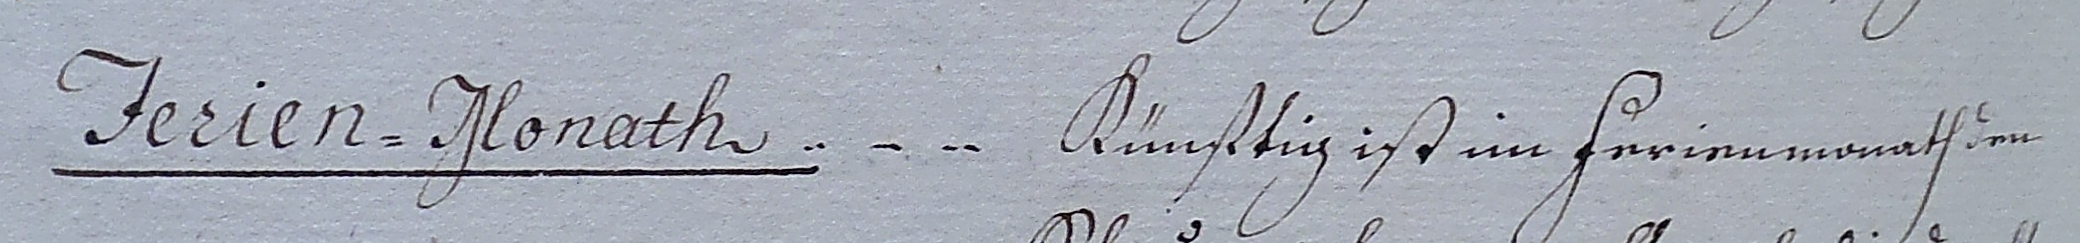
Ferien=Monath .. .. .. Künftig ist im Ferienmonath den
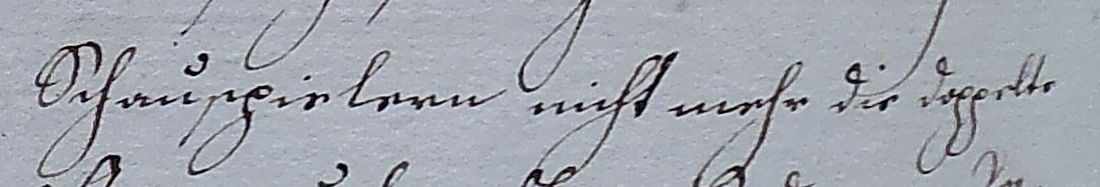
Schauspielern nicht mehr die doppelte
